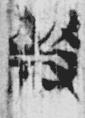殺
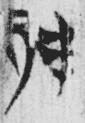邦
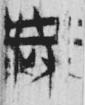無
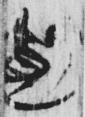飤
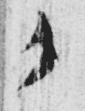人
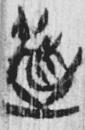道
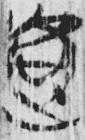○（路）
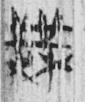無
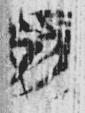○（殤）
